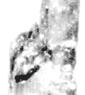㠯
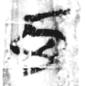西
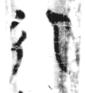北
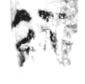行
